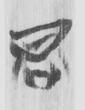君
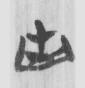鬯
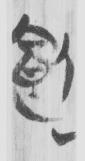飤
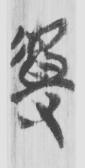{虍且又}
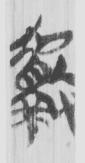獻
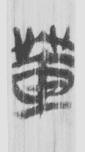{舛亼車}
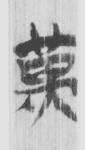黃
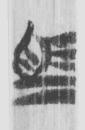馬
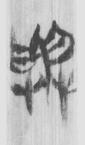與
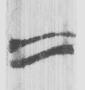二
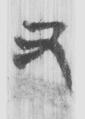又
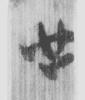{廿一}
